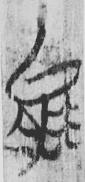能
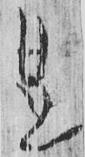也
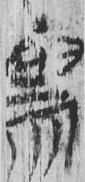○（鬼）
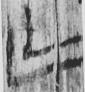亡
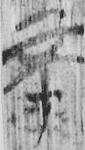不
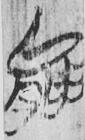能
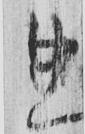也
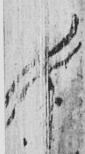民
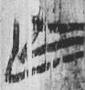乍（詛）
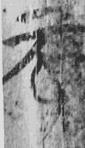而
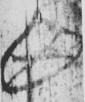甶（思）
